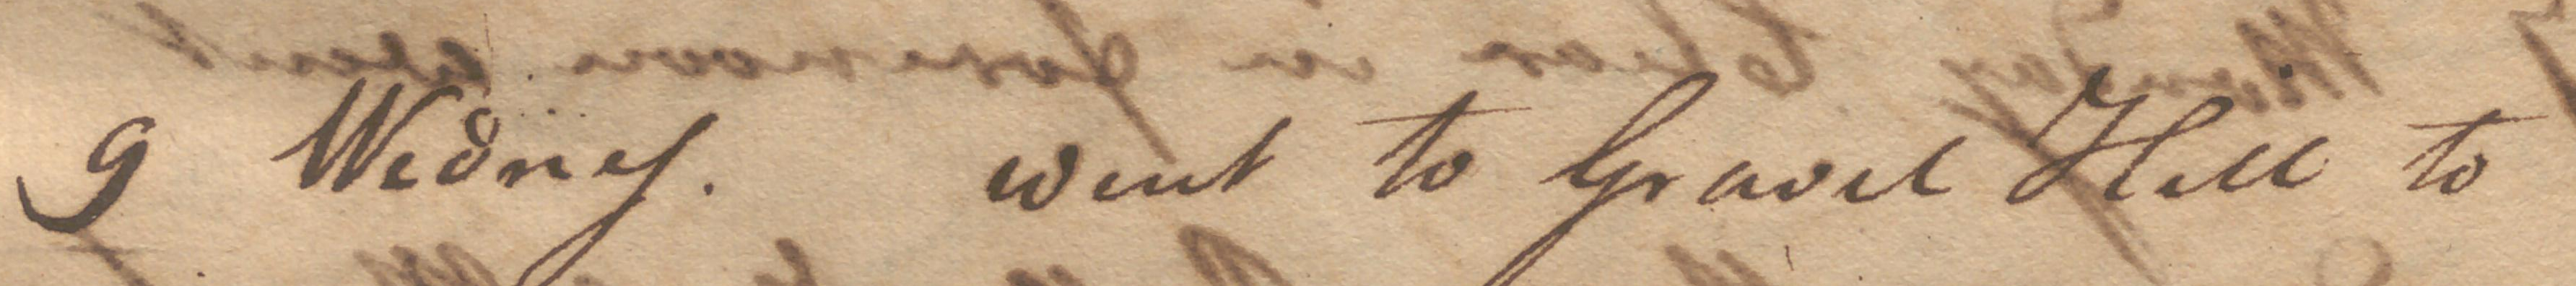9 Wednes. went to Gravel Hill to
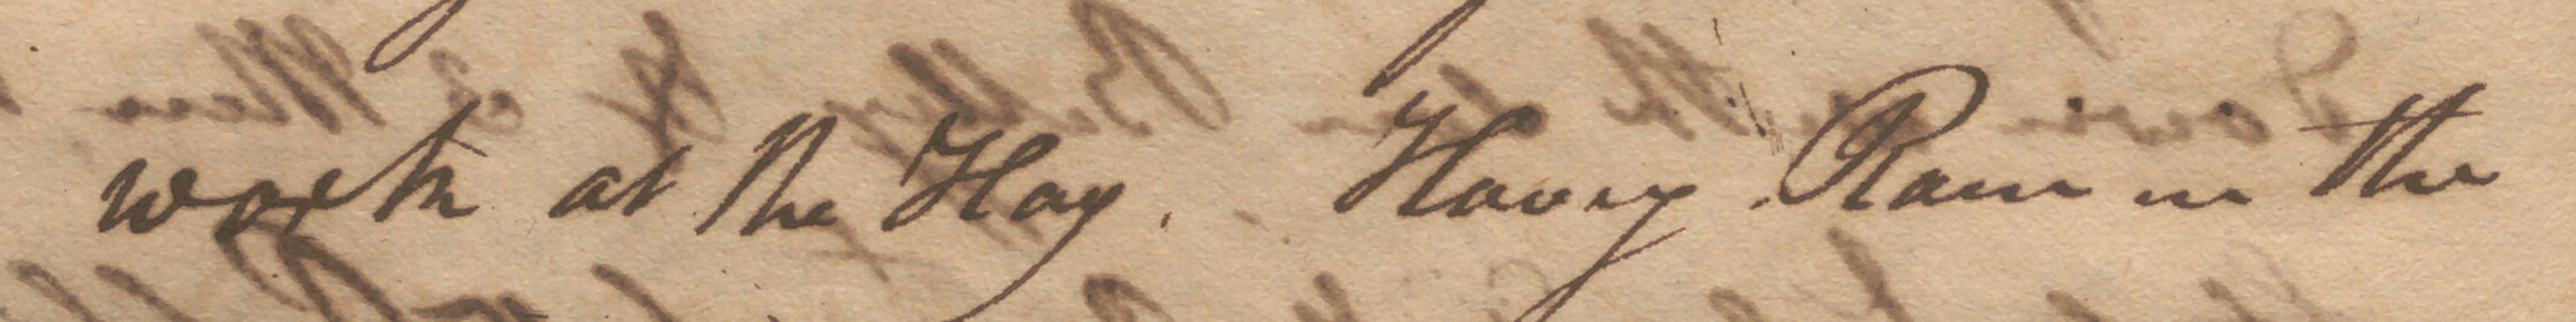work at the Hay. Havy Rain in the
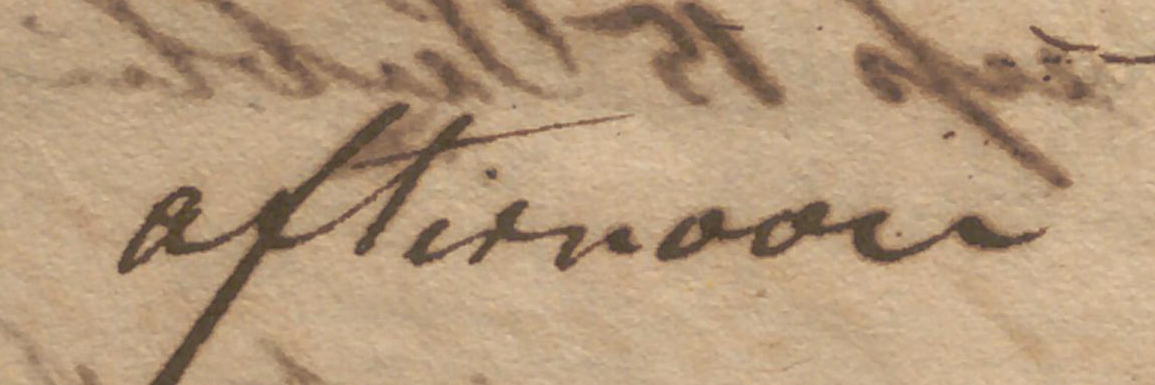afternoon
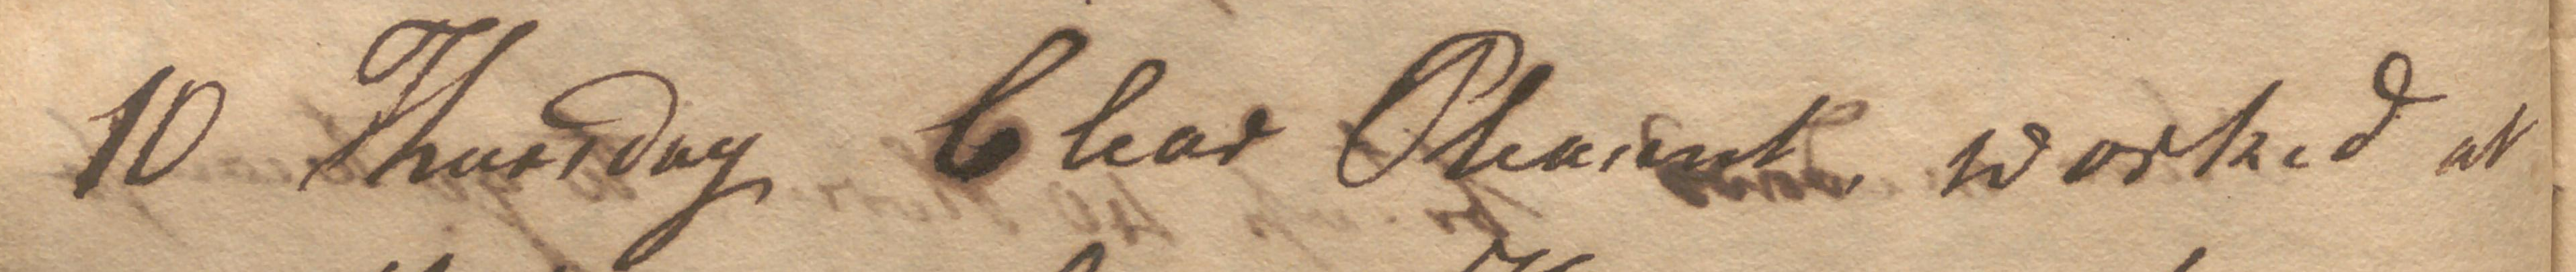10 Thursday. Clear Pleasent, worked at
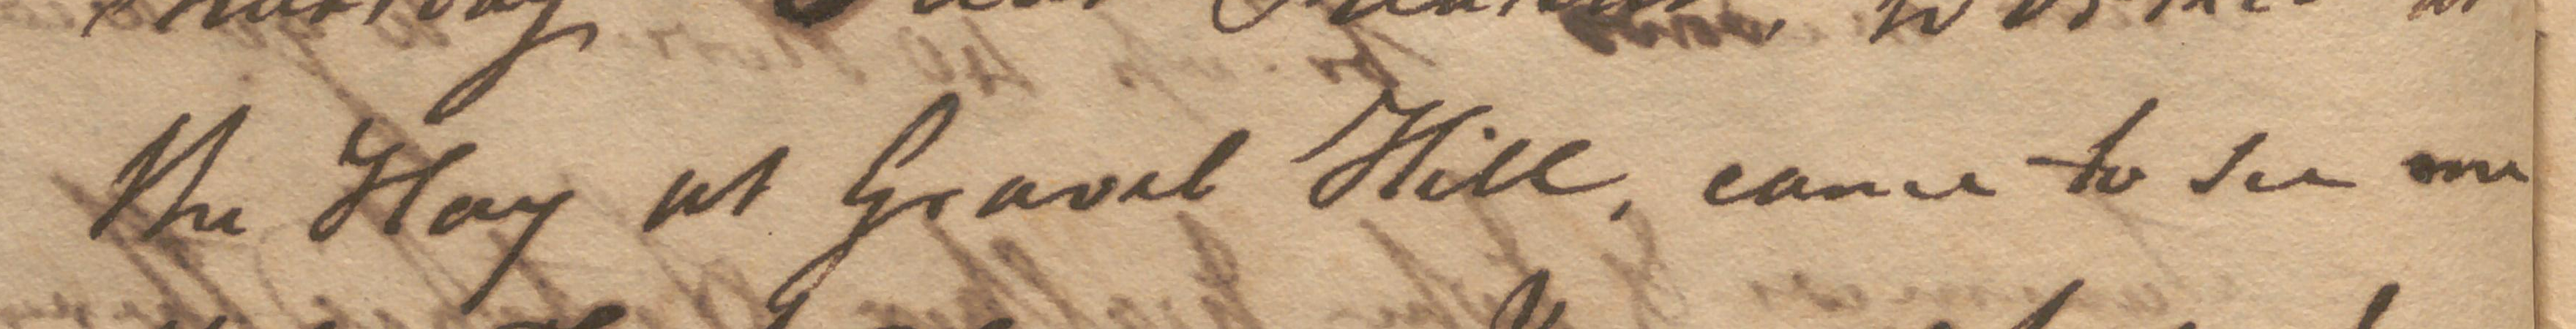the Hay at Gravel Hill, came to see me
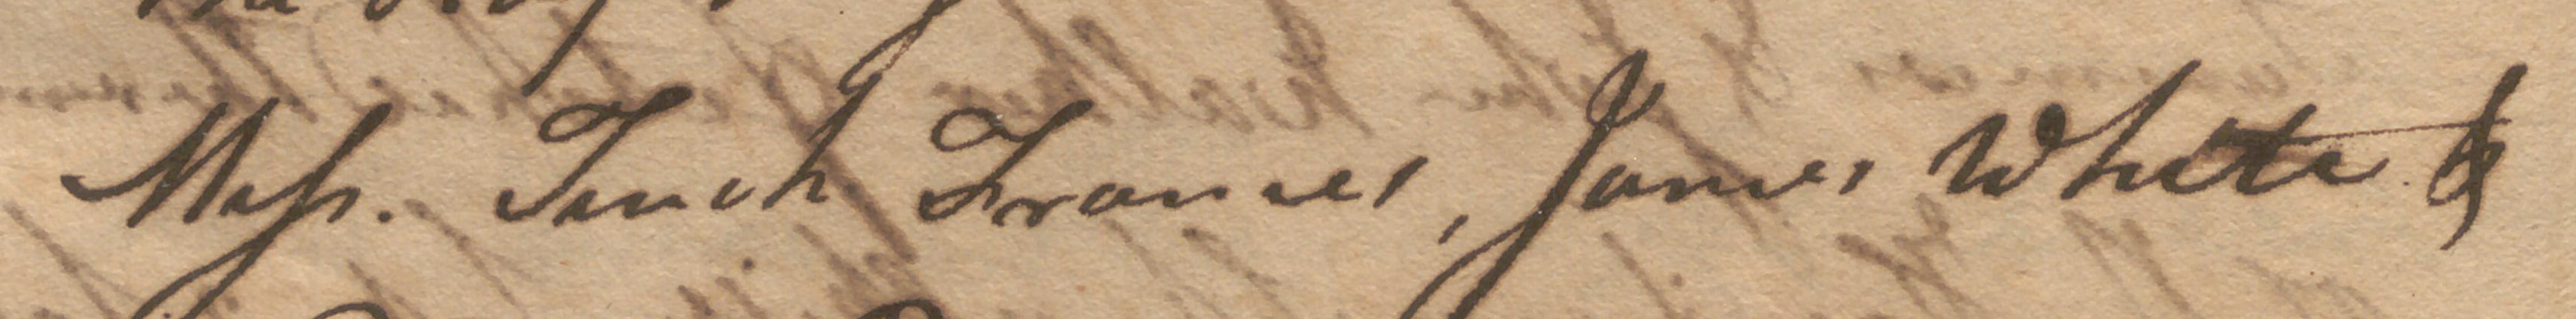Mess. Tench Frances, James White &
